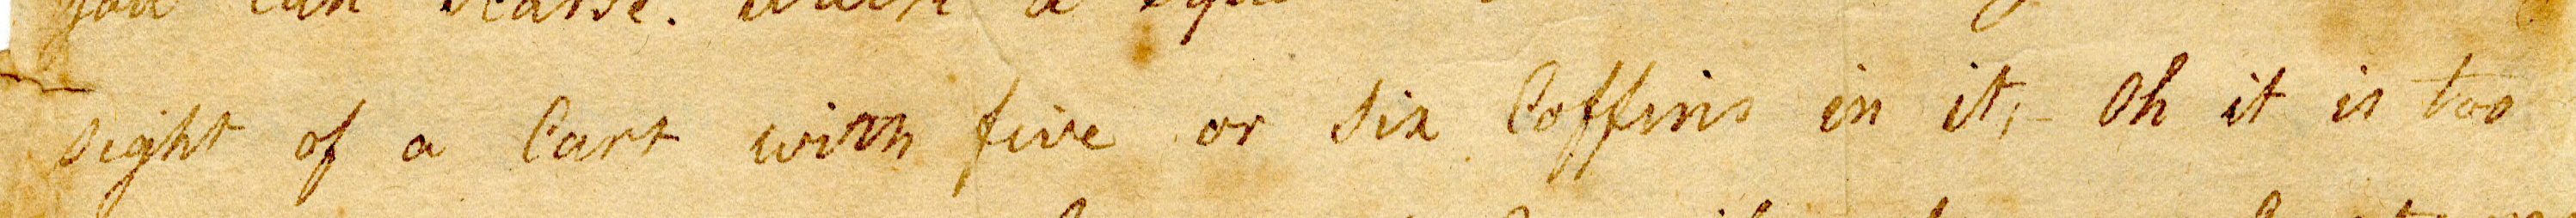sight of a cart with five or six Coffins on it, oh it is too
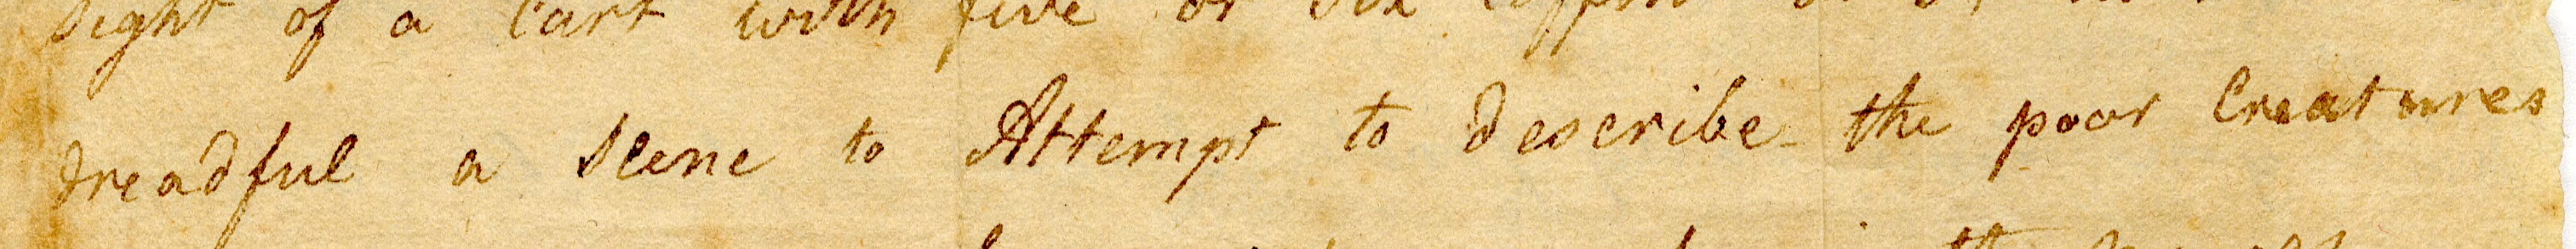dreadful a scene to Attempt to describe the poor creatures
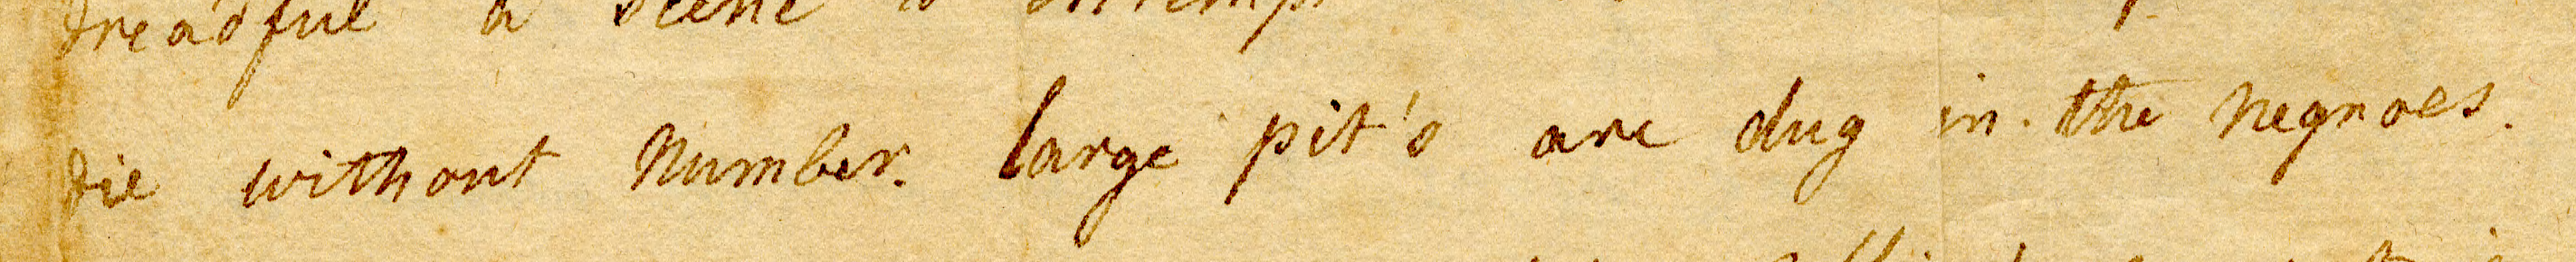die without number. large pit's are dug in the negroes
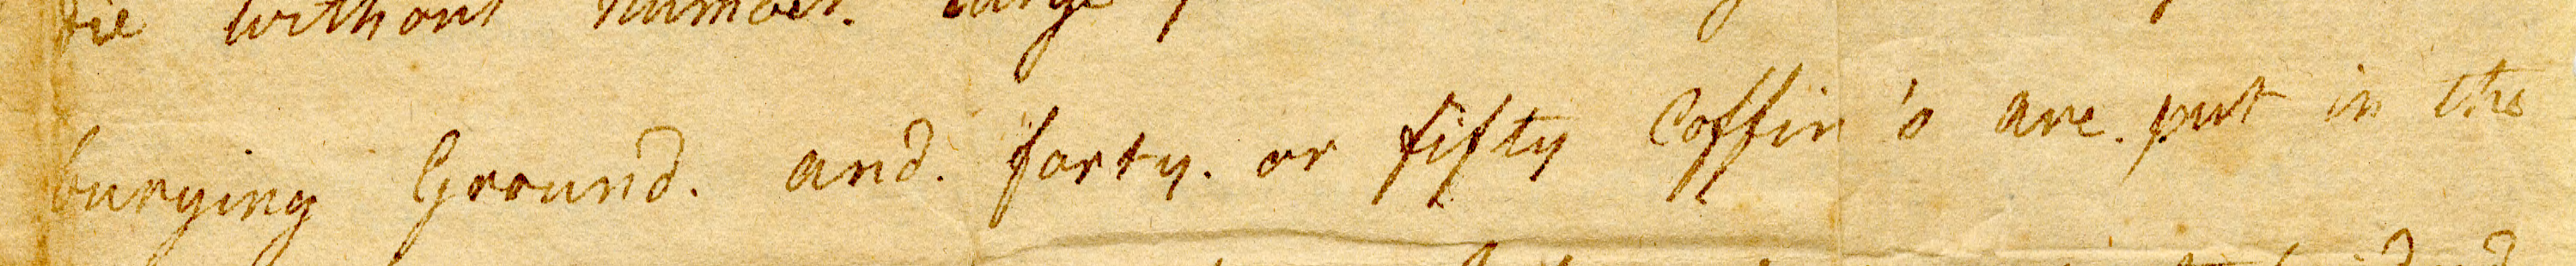burying Ground. and. forty or fifty coffin's are put in the
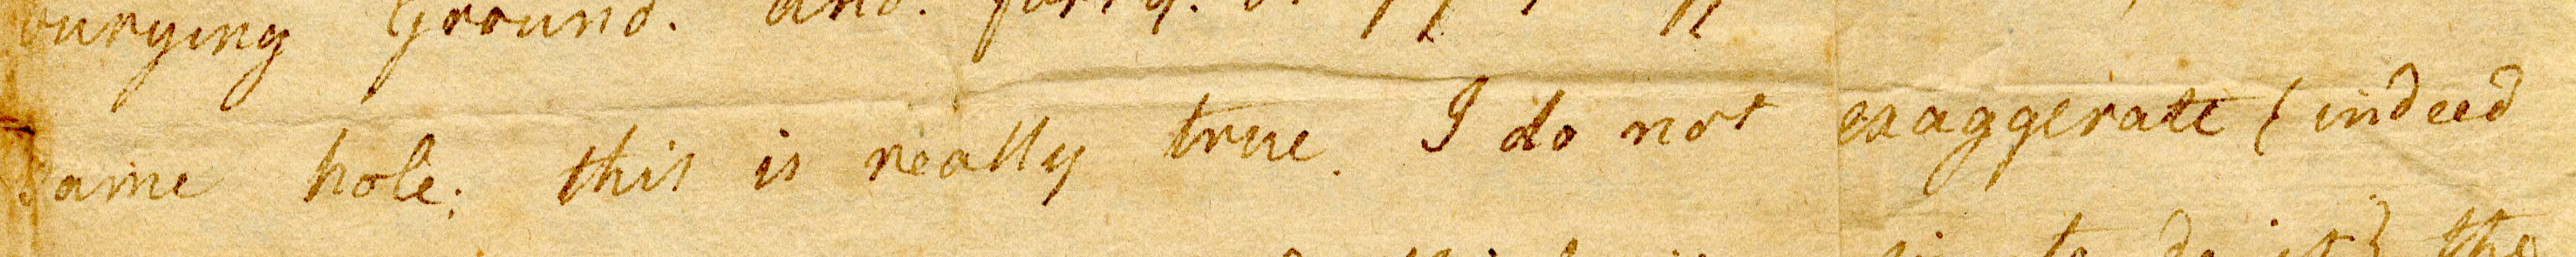same hole; this is really true I do not exaggerate (indeed
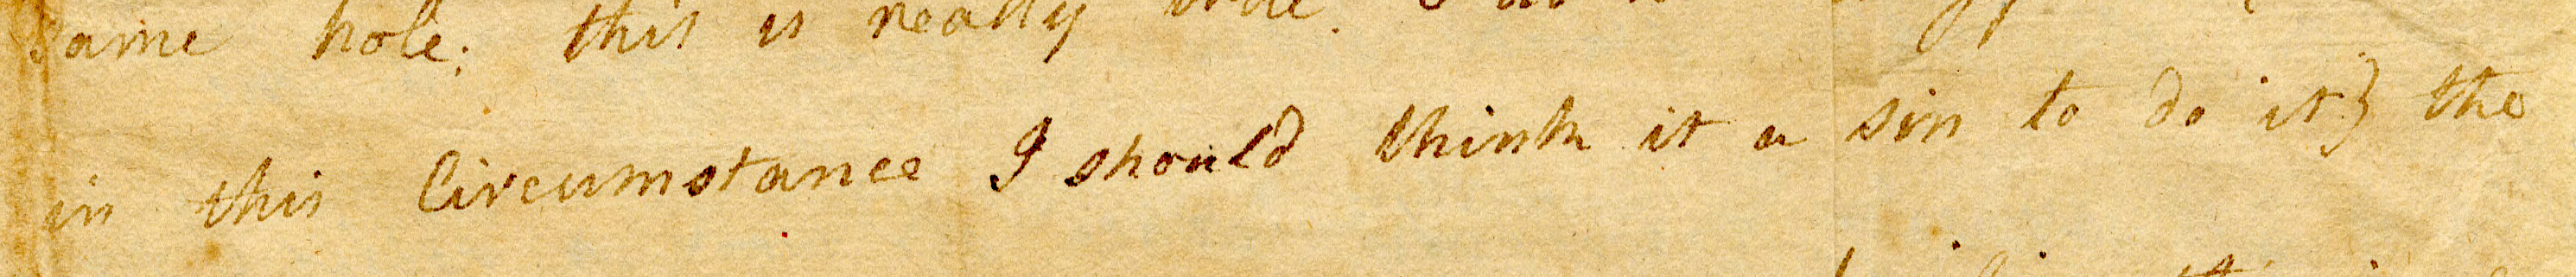in this circumstance I should think it a sin to do it) tho
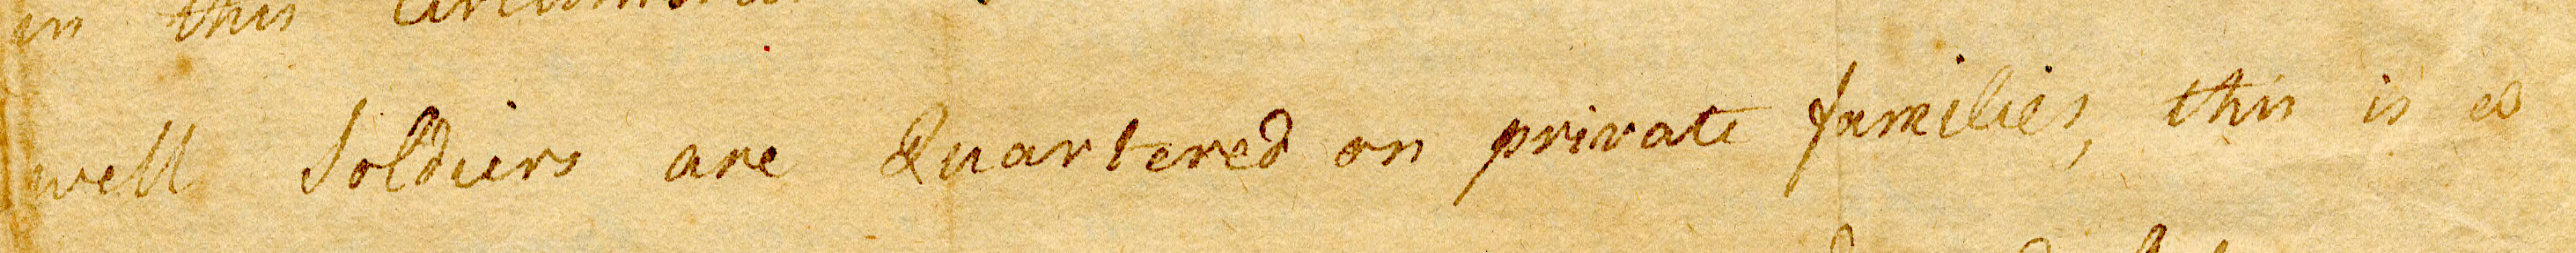well Soldiers are quartered on private families, this is a
